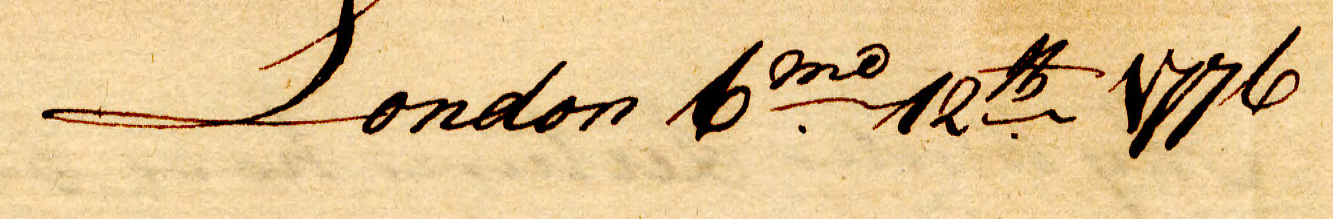London 6^mo. 12^th. 1776
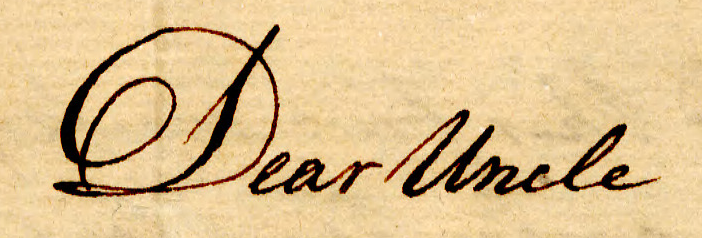Dear Uncle
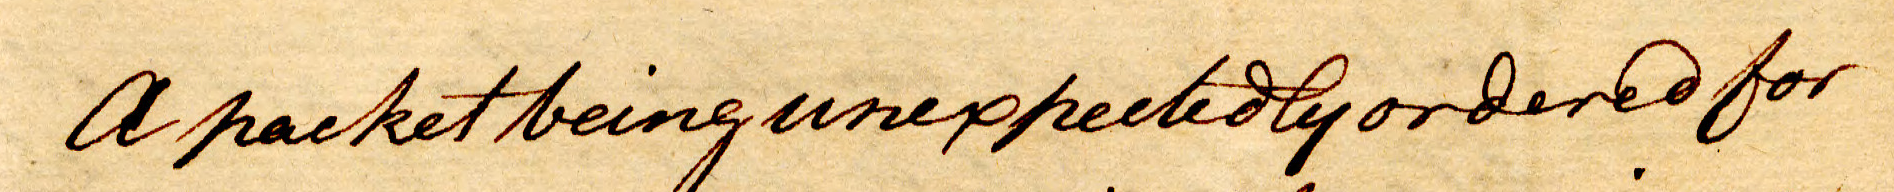A packet being unexpectedly ordered for
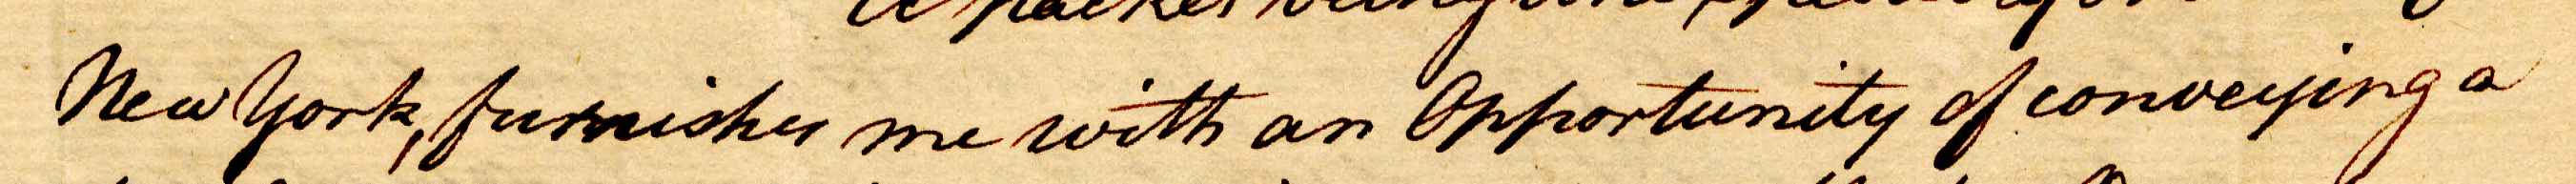New York, furnishes me with an opportunity of conveying a
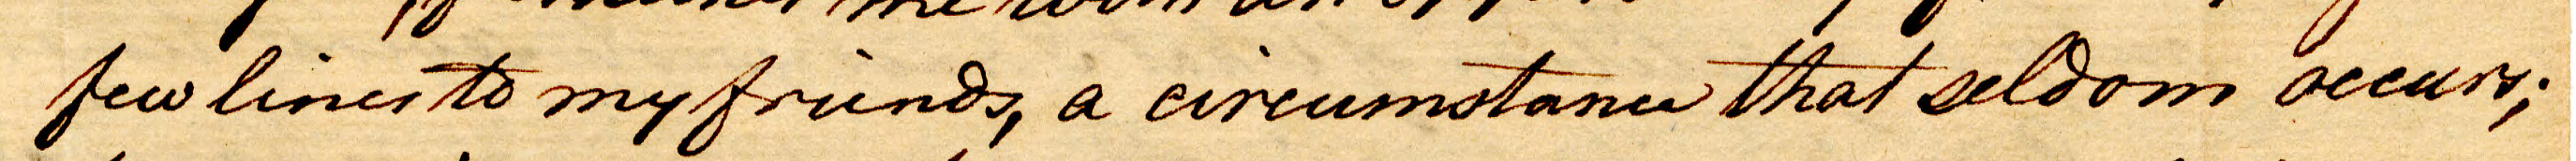few lines to my friends, a circumstance that seldom occurs;
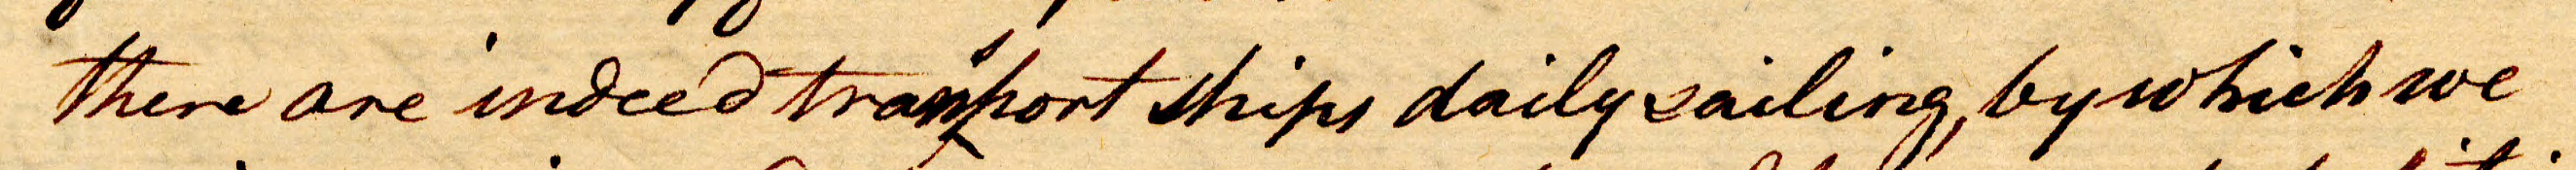there are indeed tran^sport ships daily sailing, by which we
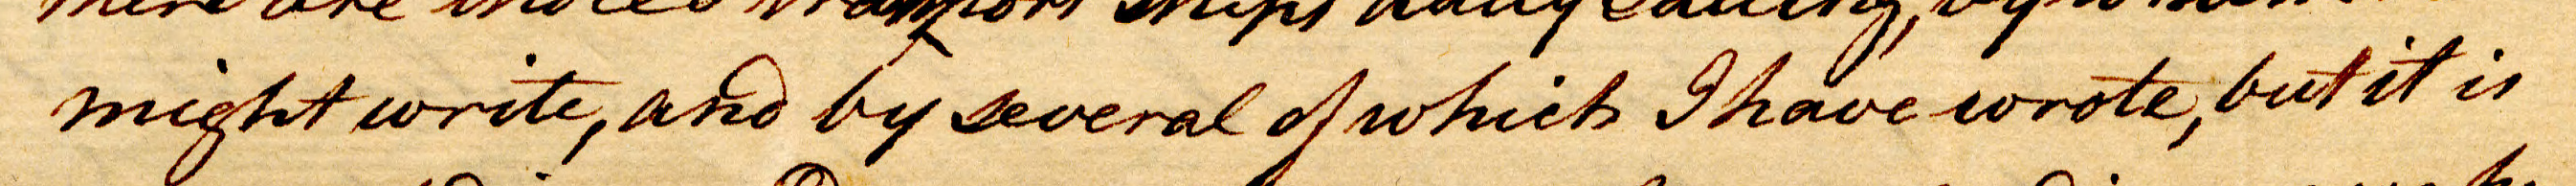might write, and by several of which I have wrote, but it is
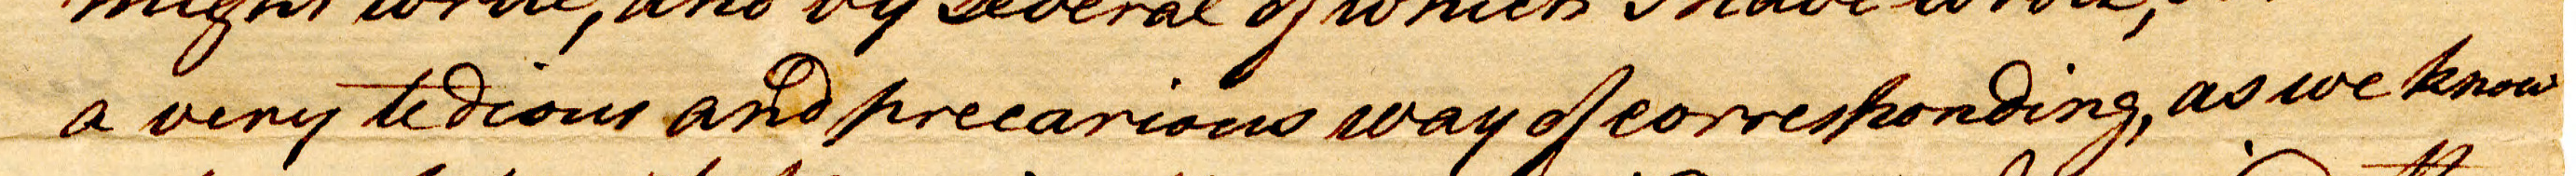a very tedious and precarious way of corresponding, as we know
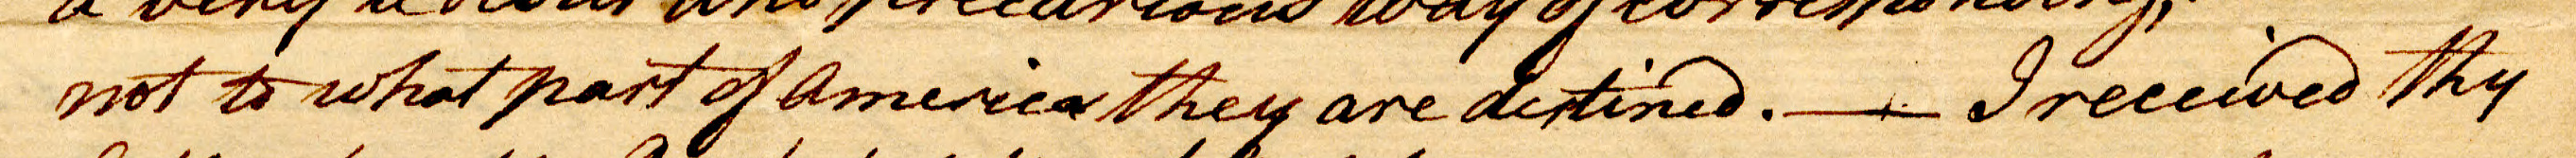not to what part of America they are destined.- I received thy
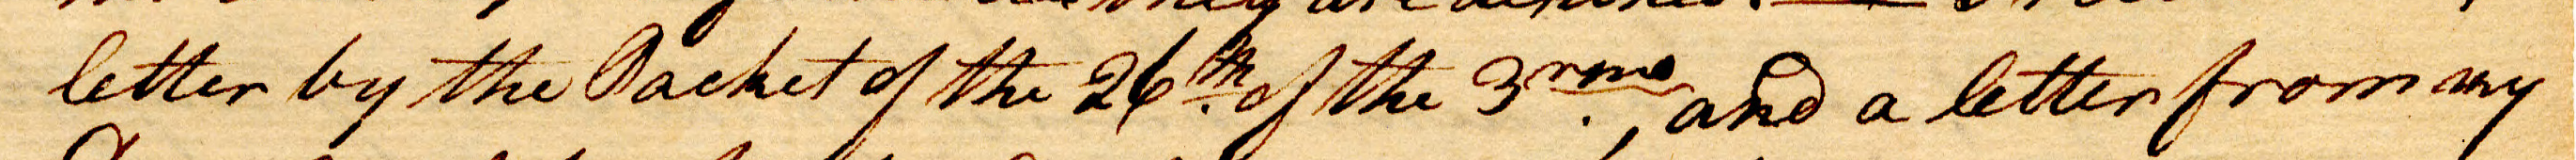letter by the Packet of the 26^th. of of the 3^rmo, and a letter from my
